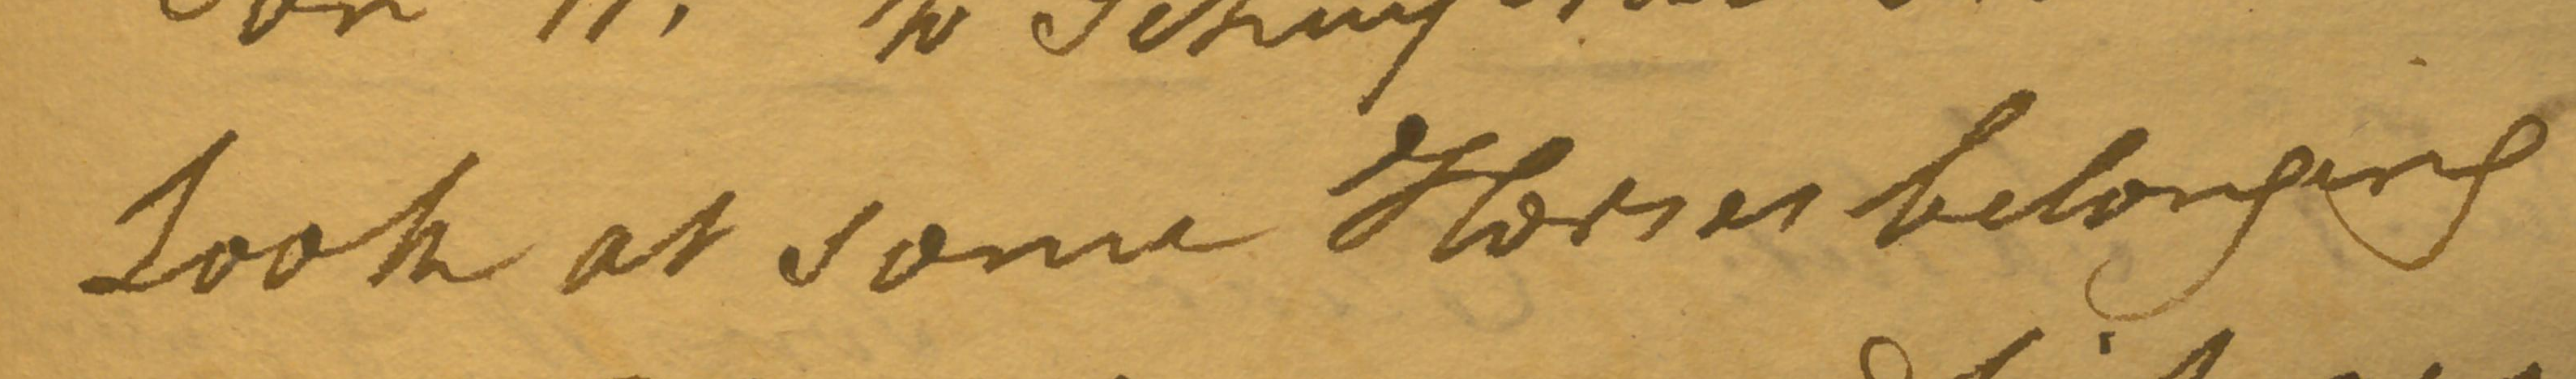Look at some Horses belonging
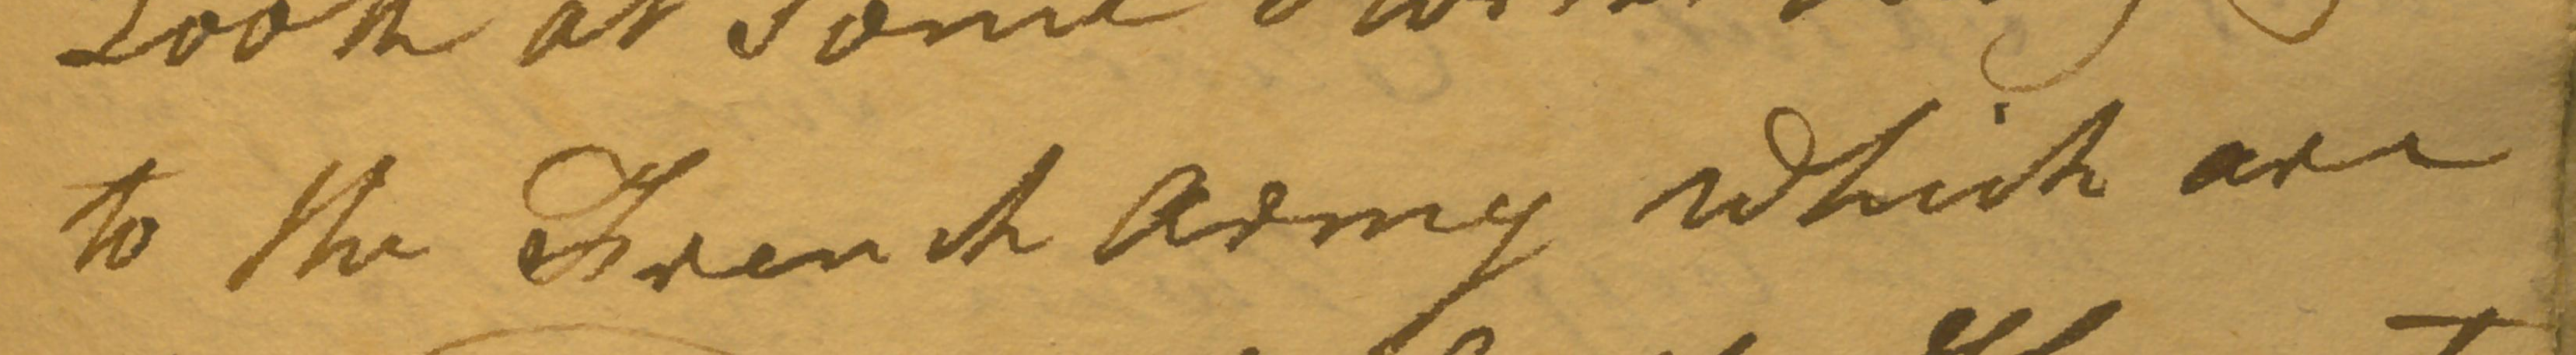to the French army which are
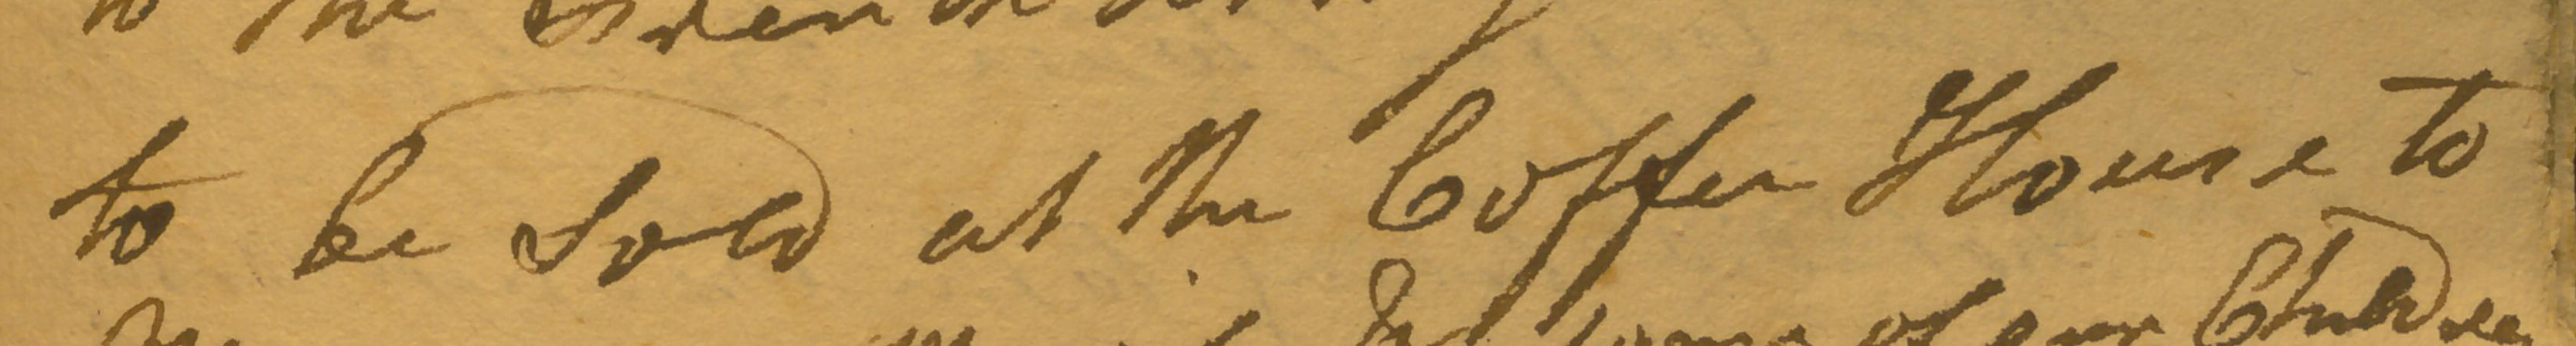to be sold at the Coffer House to
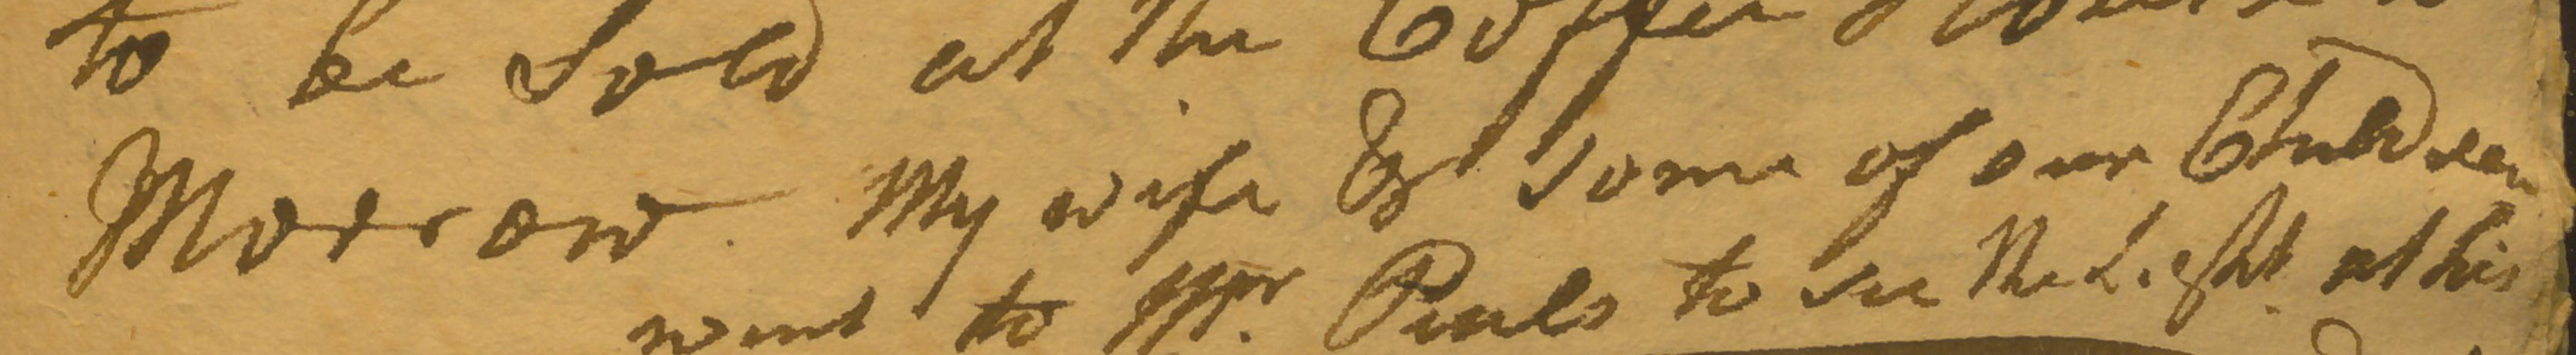Morrow. My wife & some of our Children
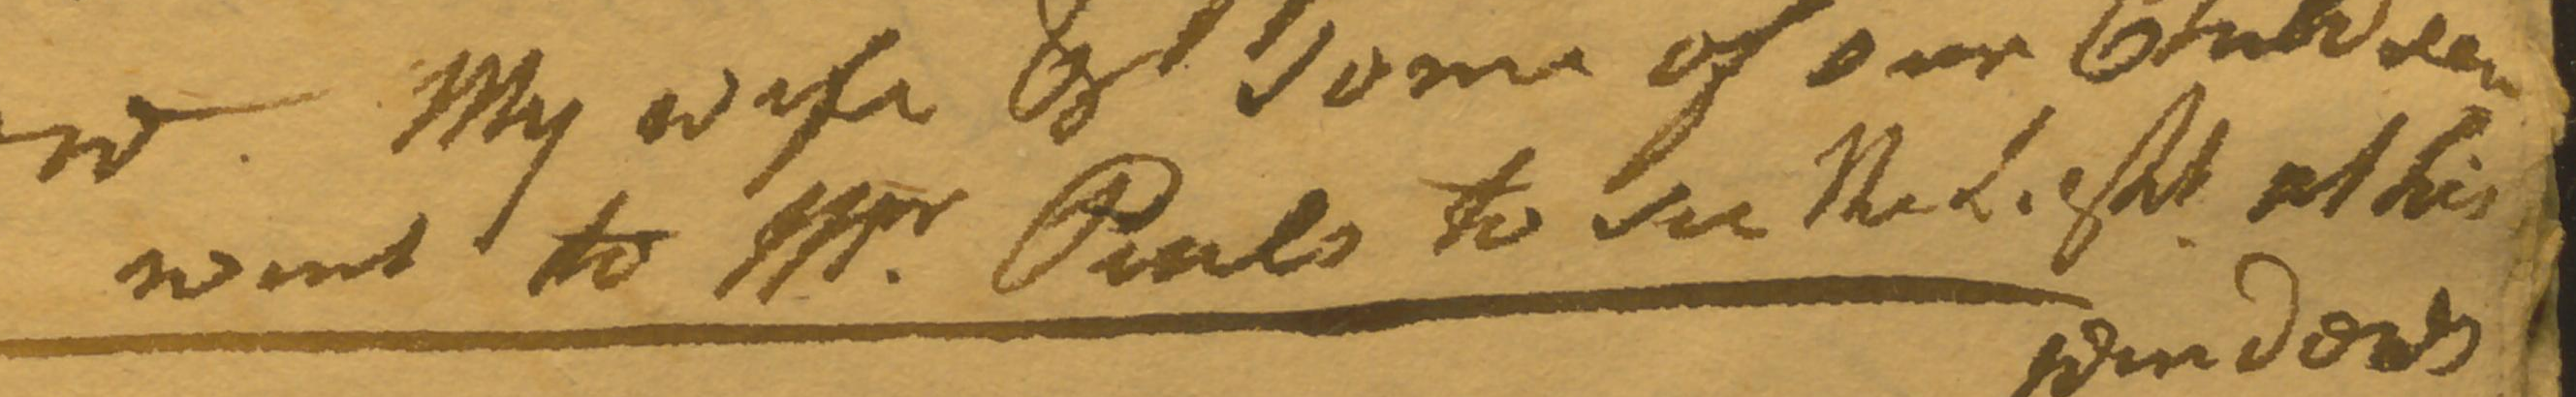went to M^r. Peals to see the Light at his
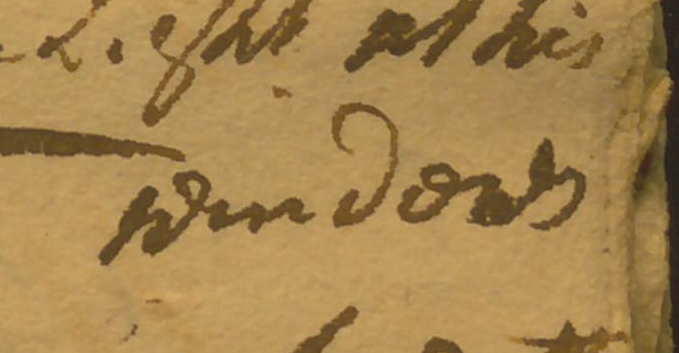windows
